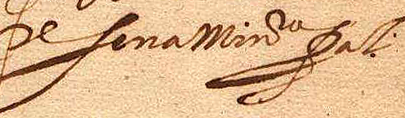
De sena minra ꝓal
